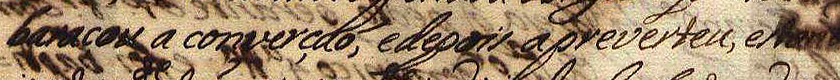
baraçou a converçaõ, e depois a preverteu, estando
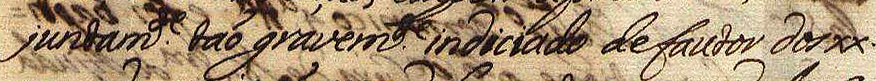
juntam.te taõ gravem.te indiciado de fautor dos xx.
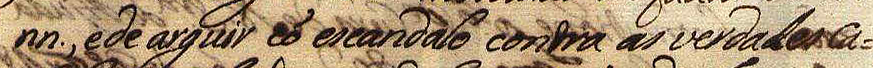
nn., e de arguir cō escandalo contra as verdades ca
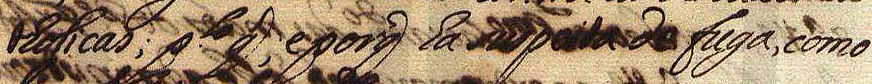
tholicas; plo q̄. e porq̄ ha suspeita de fuga, como
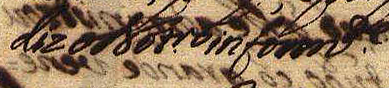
diz o Notro inform.te
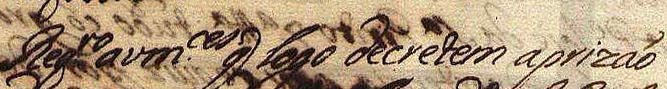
Req.ro a vm.ces q̄ logo decretem a prizaõ
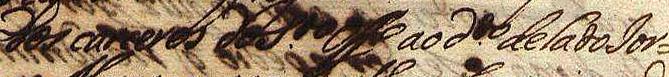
dos carceres do S.to Offo ao d.to delato Ior
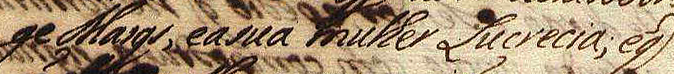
ge Masqs, e a sua mulher Lucrecia; e q̄
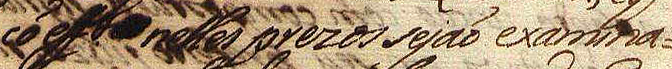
cō eff.to nelles prezos sejaõ examina
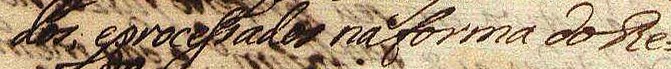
dos, e processados na forma do Re
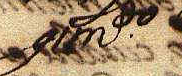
gim.to.
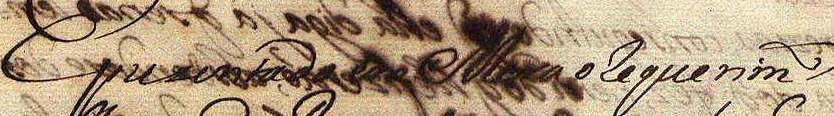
E prezentado na Meza o Requerimto
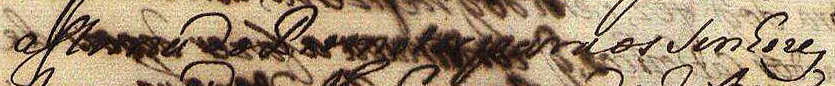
assima do Promotor para os Senhores
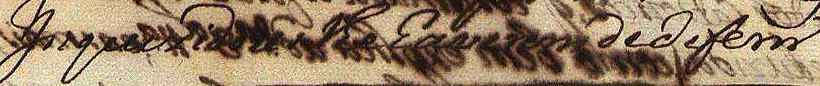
Jnquizidores lhe haverem de deferir
